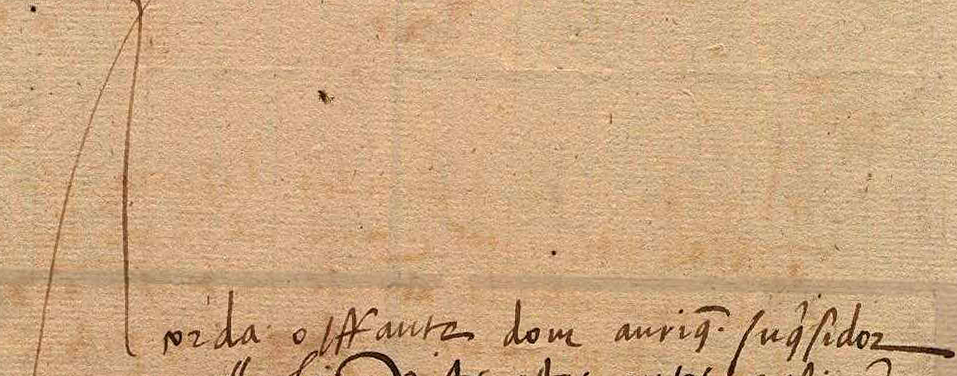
Acorda o Jffante dom anriq̄. Jnqisidor
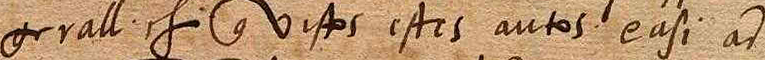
gerall cꝭ q̄ vistos estes autos e asi a ē
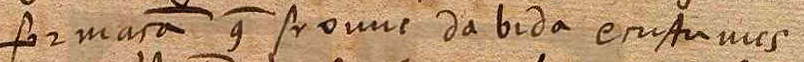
formaçā q̄ se ouue da vida e custumes
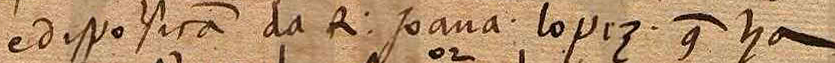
e disposiçā da R. Joana lopez. q̄ ha
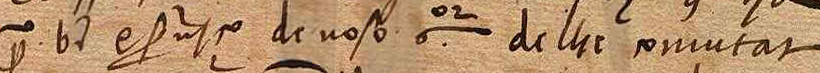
p̄o bē e ꞩujço de noso sor de lhe comutar
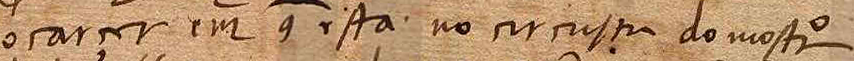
o carcer em q̄ esta no circujtu do mostro
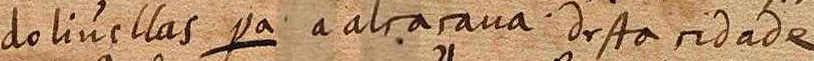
doliuellas ꝑa a alcaçaua desta cidade
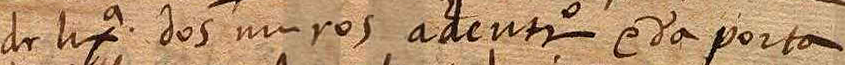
de lixa. dos muros adentro e da porta
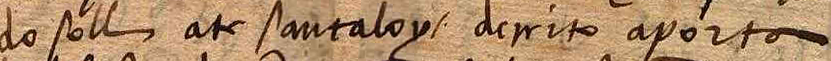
do soll ate santaloy /. dereito a porta
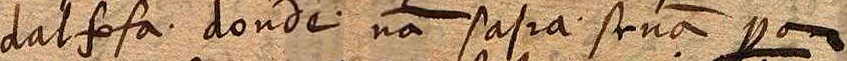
dalfofa. donde nā saJra senā ꝑa
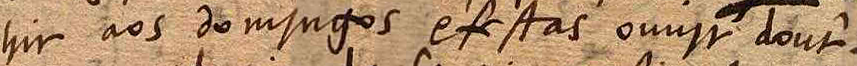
hir aos domjngos e festas ouujr douti
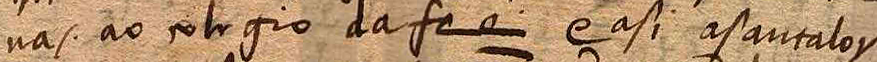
na/. ao colegio da fee e asi a santaloy
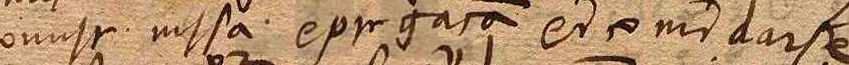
ouuJr mJsa e pregaçā e ēcomēdarse
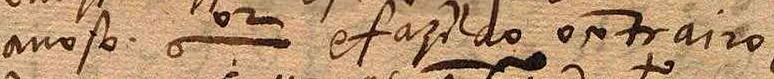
a noso sor e fazēdo o c̄otrairo
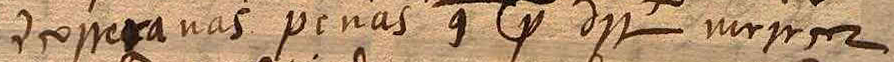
ēcorrera nas penas q̄ p̄o djrto merecer
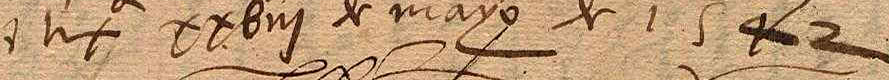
ē lixa xxbiij de mayo de 1542
